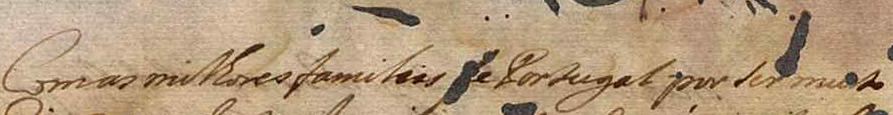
Com as milhores familias _e Portugal por ser muito
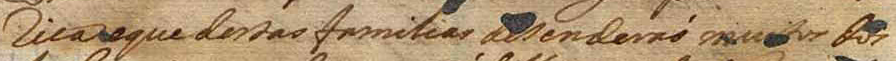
Rica e que destas familias desenderaõ muitos dos
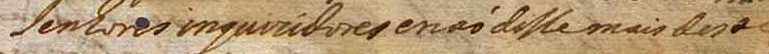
Senhores inquizidores e naõ disse mais deste
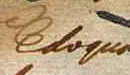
E do qu
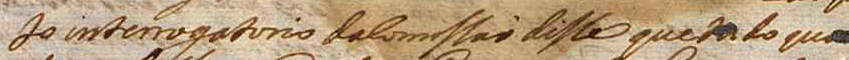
to interrogatorio da Comissaõ disse que tudo qu
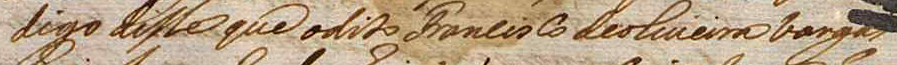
digo disse que o dito Francisco de oliueira vargas
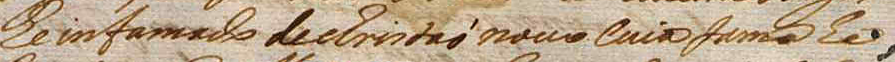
he infamado de christaõ nouo cuia fama he
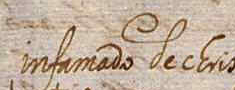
infamado de chris
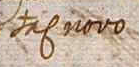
taõ novo
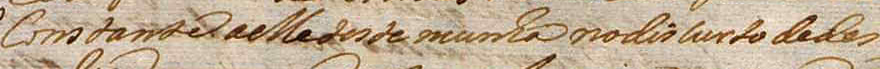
Constante a elle testemunha no discurso de des
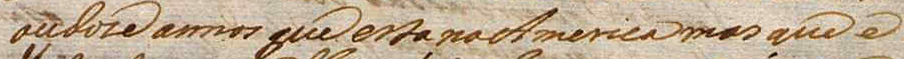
ou doze annos que esta na America mas que e
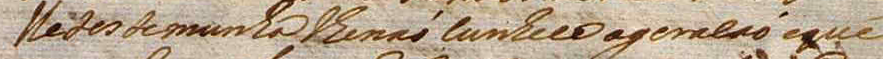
lle testemunha lhe naõ cunhece a geraçaõ e que
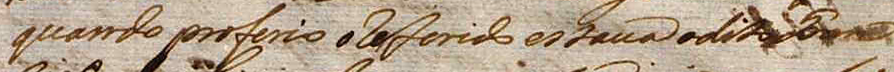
quando proferio o Referido estaua o dito Fran
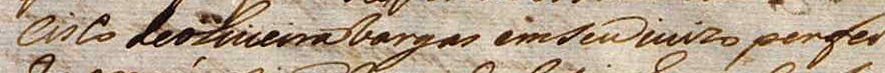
CisCo de oliueira vargas em seu iuizo perfer
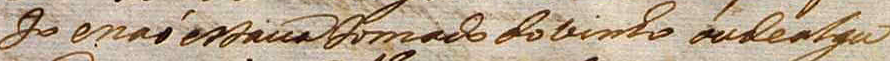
to e naõ estaua tomado do vinho ou de algu
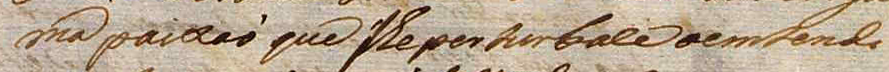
ma paixaõ que lhe perturbace o emtendi
